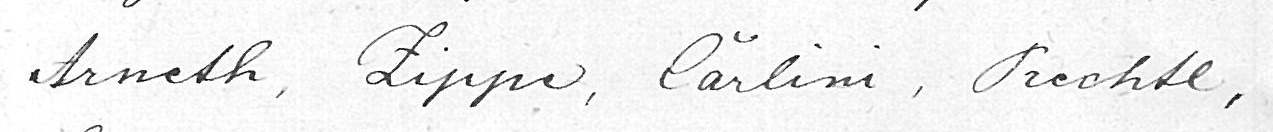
Arneth, Zippe, Carlini, Prechtl,
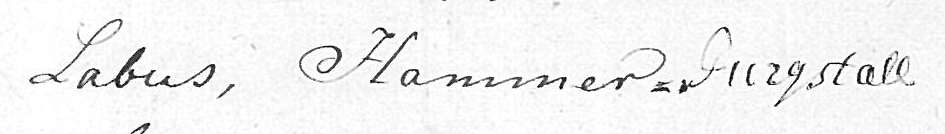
Labus, Hammer-Purgstall
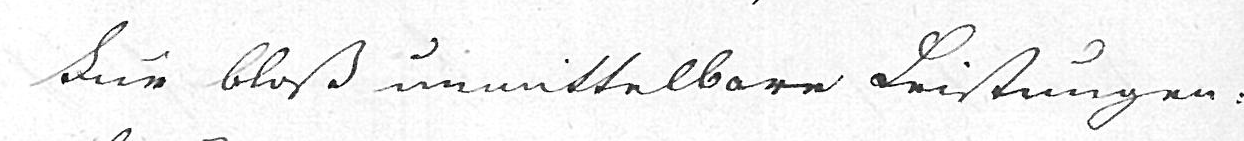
Für bloß unmittelbare Leistungen:
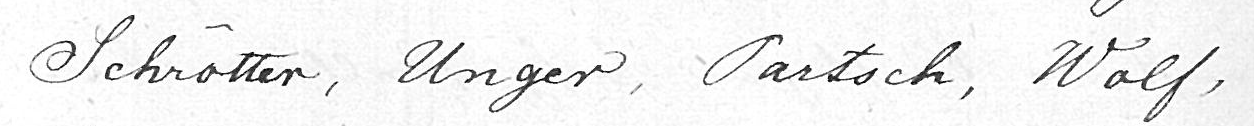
Schrötter, Unger, Partsch, Wolf,
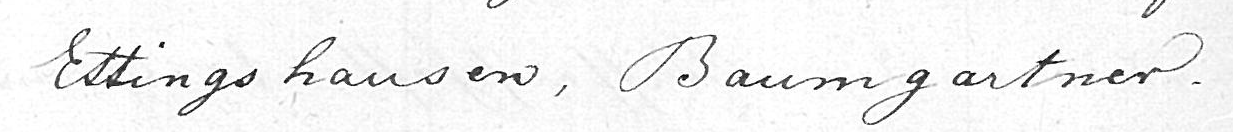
Ettingshausen, Baumgartner
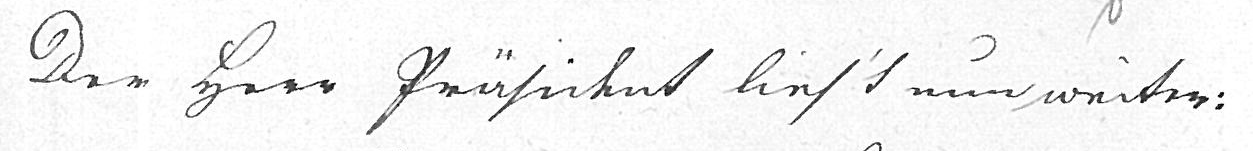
Der Herr Präsident liest nun weiter:
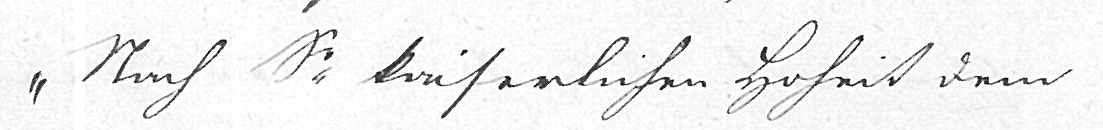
"Nach Sr. kaiserlichen Hoheit dem
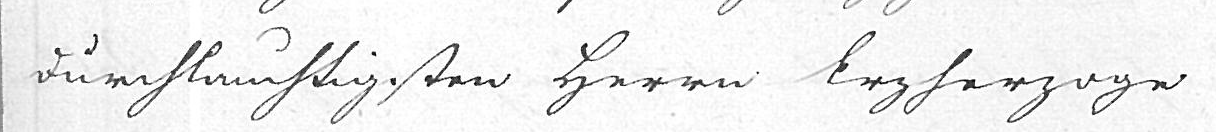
durchlauchtigsten Herrn Erzherzoge
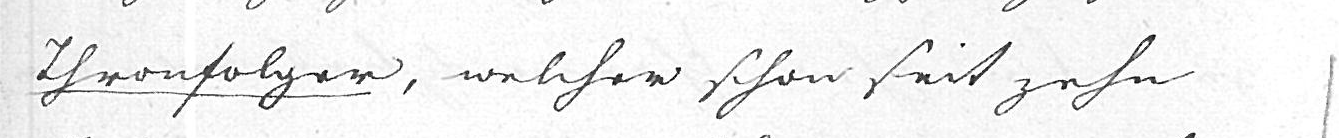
Thronfolger, welcher schon seit zehn
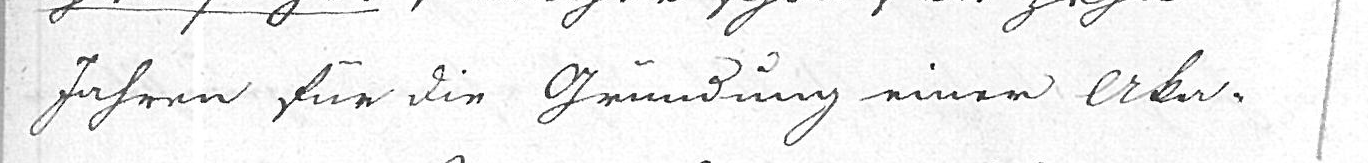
Jahren für die Gründung einer Aka-
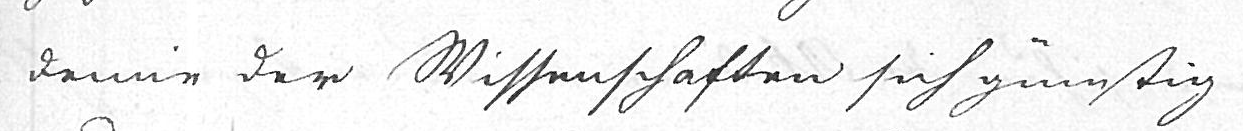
demie der Wissenschaften sich günstig
